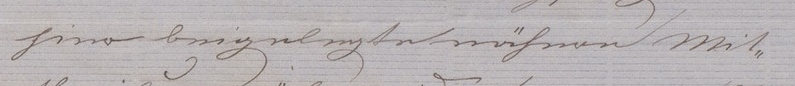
hier beigelegte nähere Mit-
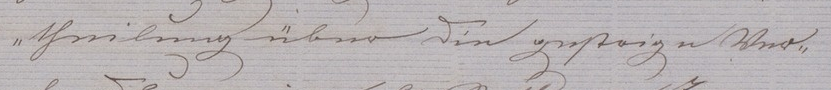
theilung über die gestrige Ver-
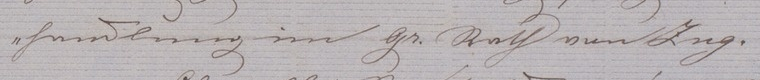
handlung im Gr. Rath von Zug.
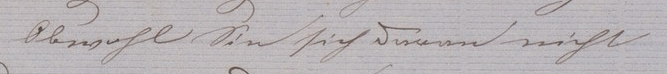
Obwohl Sie sich daran nicht
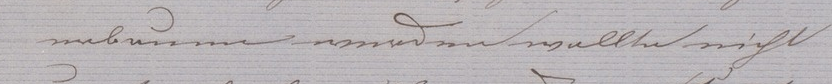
erbauen werden wollte nicht
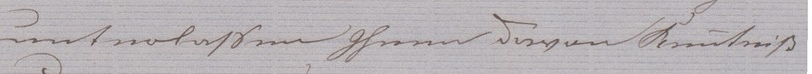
unterlassen Ihnen davon Kenntniß
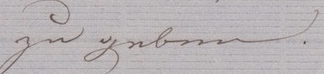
zu geben.
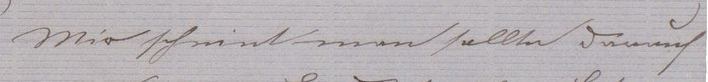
Mir scheint man sollte darauf
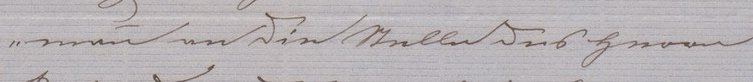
mann an die Stelle des Herrn
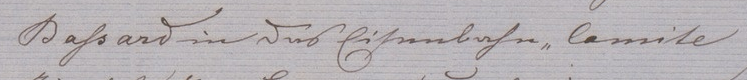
Bossard in das Eisenbahn–Comite
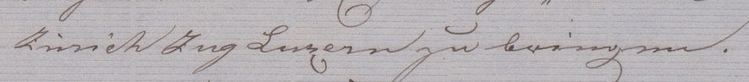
Zürich Zug Luzern zu bringen.
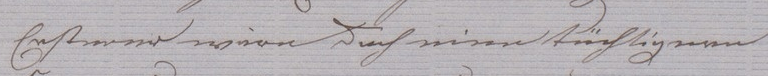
Ersterer wäre doch eine tüchtigere
